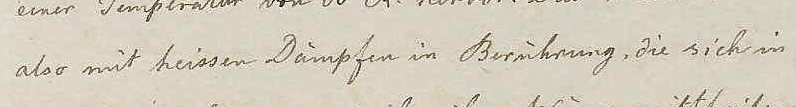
also mit heissen Dämpfen in Berührung die sich in
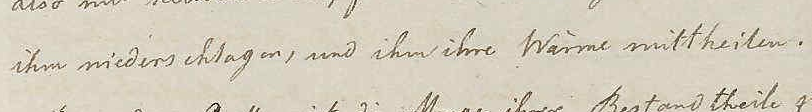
ihm niederschlagen, und ihm ihre Wärme mittheilen.
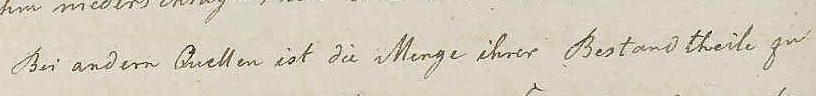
Bei andern Quellen ist die Menge ihrer Bestandtheile zu
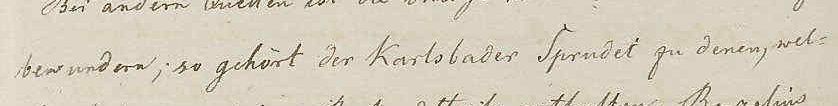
bewundern; so gehört der Karlsbader Sprudel zu denen, wel-
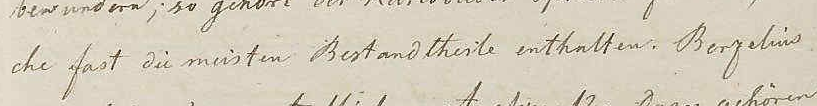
che fast die meisten Bestandtheile enthalten. Berzelius
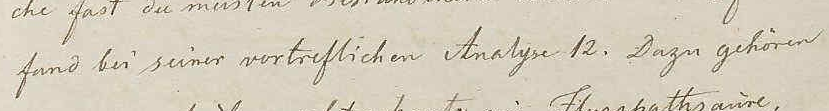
fand bei seiner vortreflichen Analyse 12. Dazu gehören
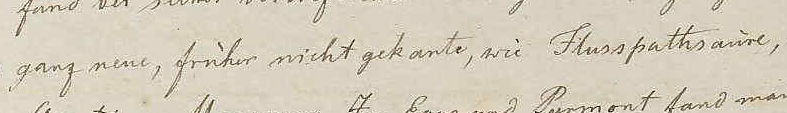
ganz neue, früher nicht gekante, wie Flusspathsäure,
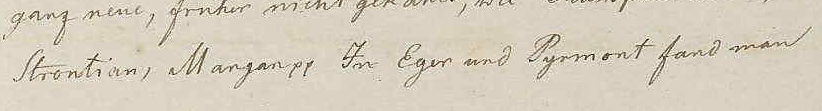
Strontian, Mangan pp In Eger und Pyrmont fand man
